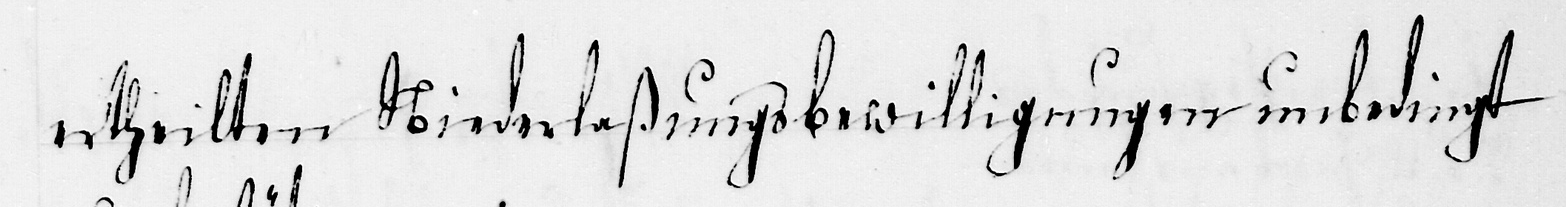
ertheilten Niederlaßungsbewilligungen unbedingt
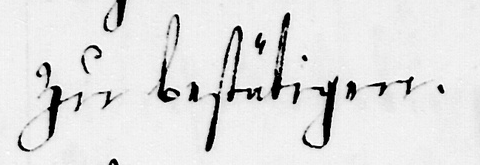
zu bestätigen.
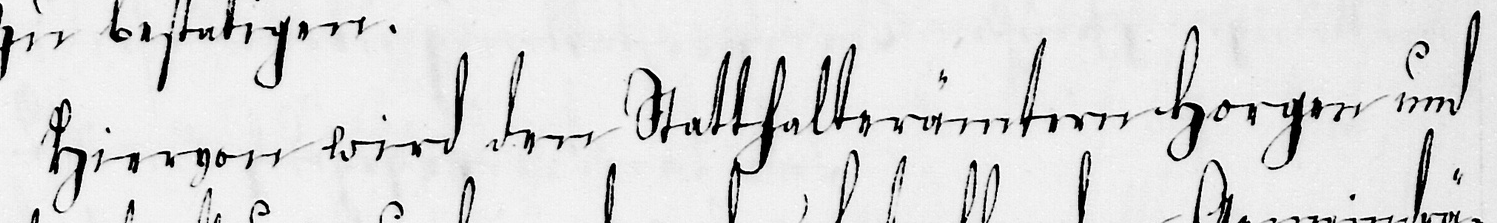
Hiervon wird den Statthalterämtern Horgen und
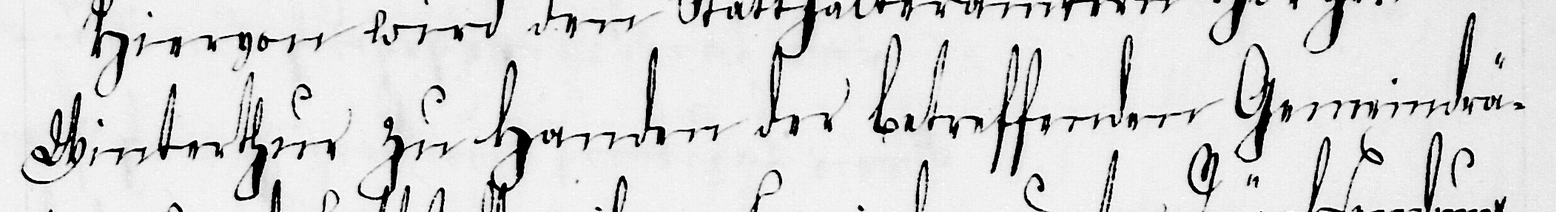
Winterthur zu Handen der betreffenden Gemeindrä¬
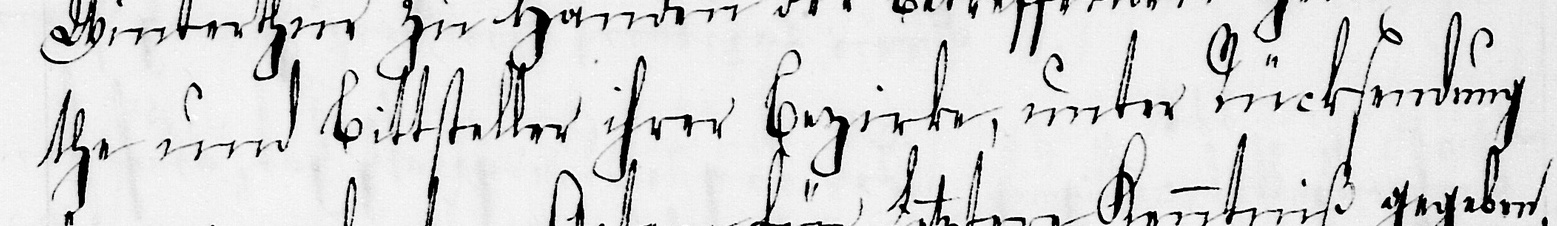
the und Bittsteller ihrer Bezirke, unter Rücksendung
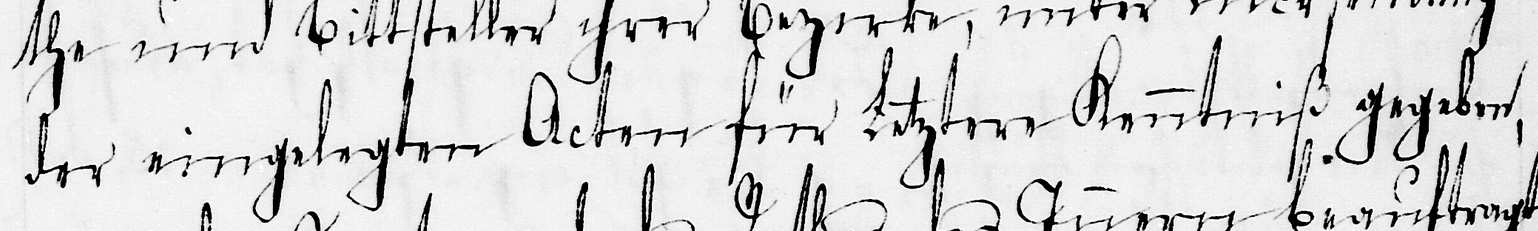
der eingelegten Acten für Letztere Kenntniß gegeben,
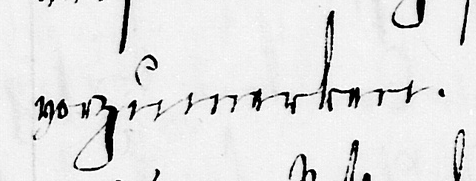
vorzumerken.
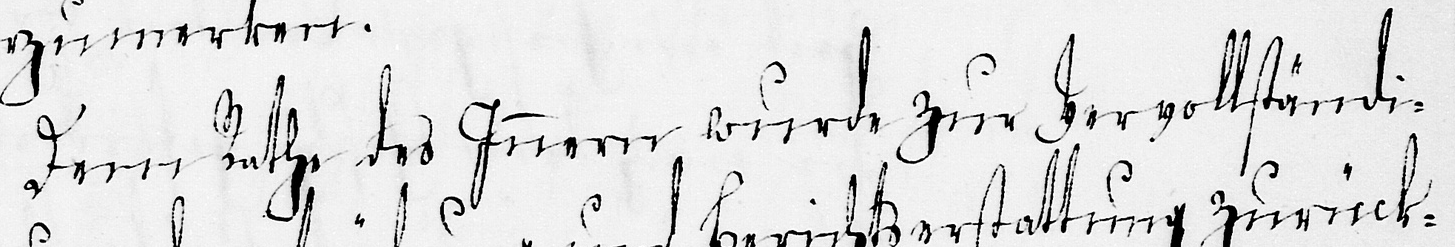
Dem Rathe des Innern wurde zur Vervollständi¬
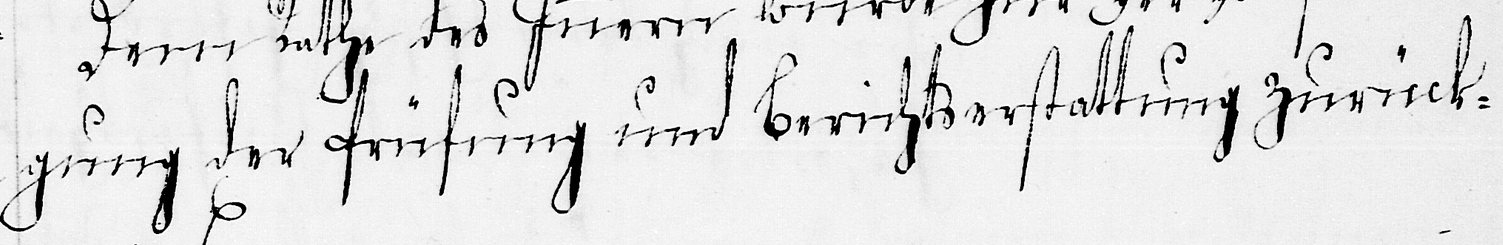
gung der Prüfung und Berichtserstattung zurück¬
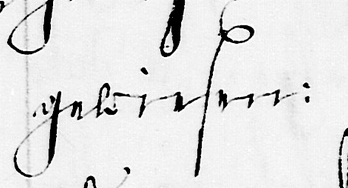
gewiesen:
